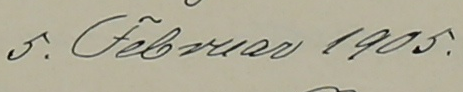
5. Februar 1905.
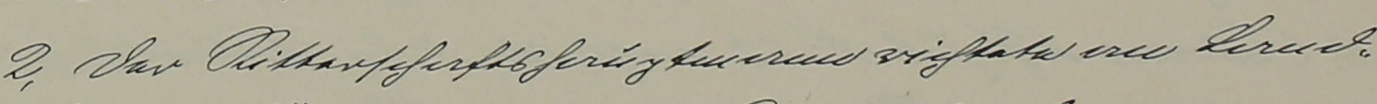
2. Der Ritterschaftshauptmann richtete an Land-
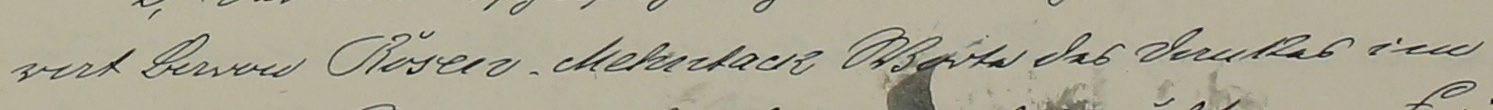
rat Baron Rosen-Mehntack Worte des Dankes im
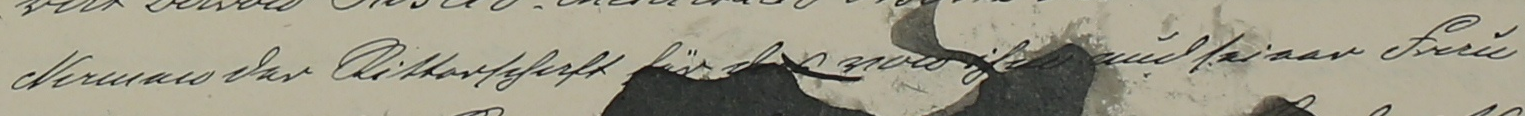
Namen der Ritterschaft für das von ihm und seiner Frau
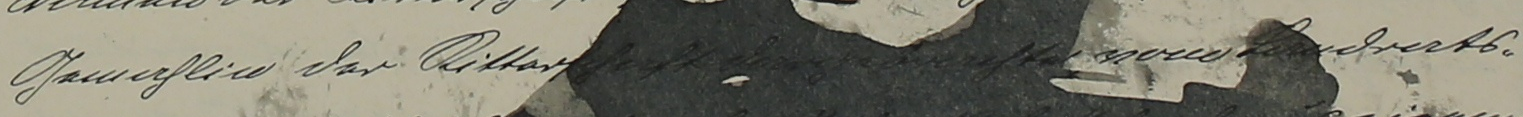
Gemahlin der Ritterschaft dargebrachte vom Landrats-
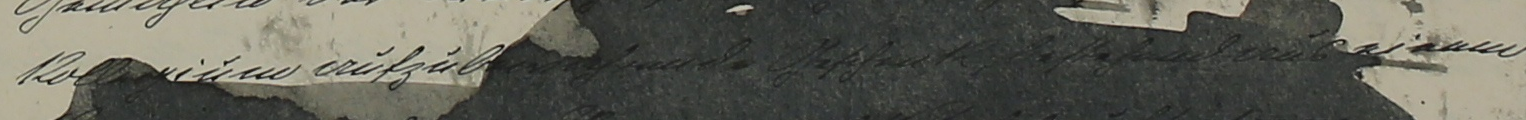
kollegium aufzubewahrende Geschenk, bestehend aus einem
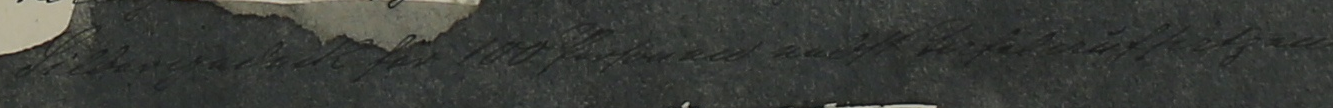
Silbergedeck für 100 Personen nebst Tafelaufsätzen.
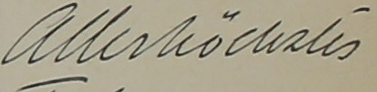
Allerhöchstes
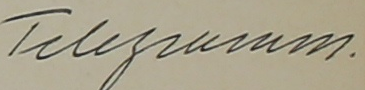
Telegramm
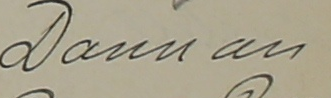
dank an
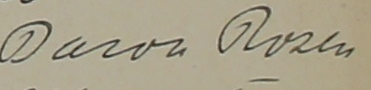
Baron Rosen
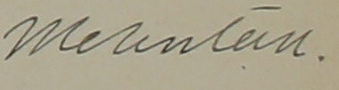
Mehntak.
